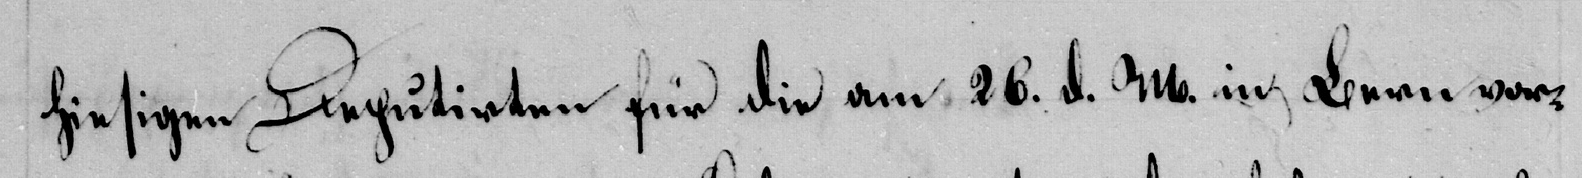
hiesigen Deputirten für die am 26. d. M. in Bern vor¬
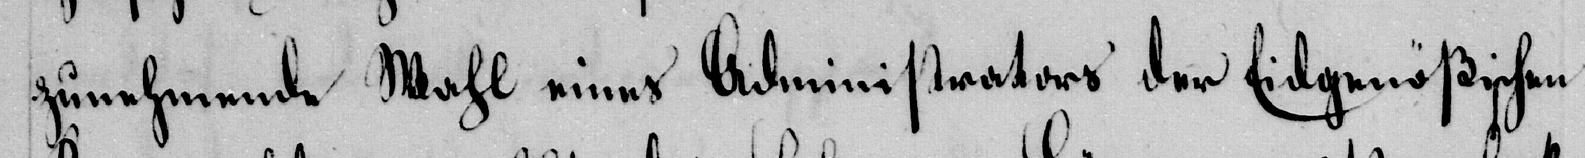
zunehmende Wahl eines Administrators der Eidgenößischen
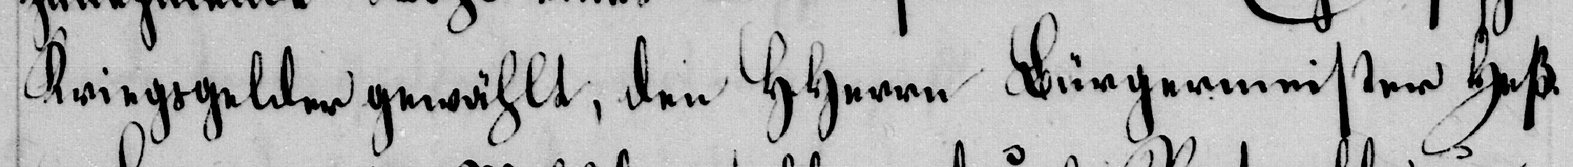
Kriegsgelder gewählt, den HHerrn Bürgermeister Heß.
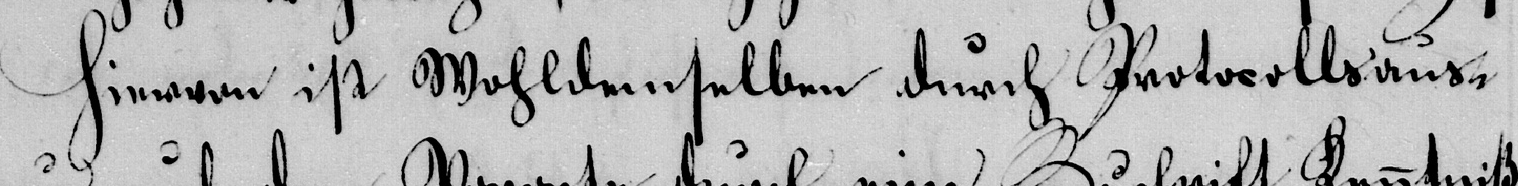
Hiervon ist Wohldemselben durch Protokollsaus¬
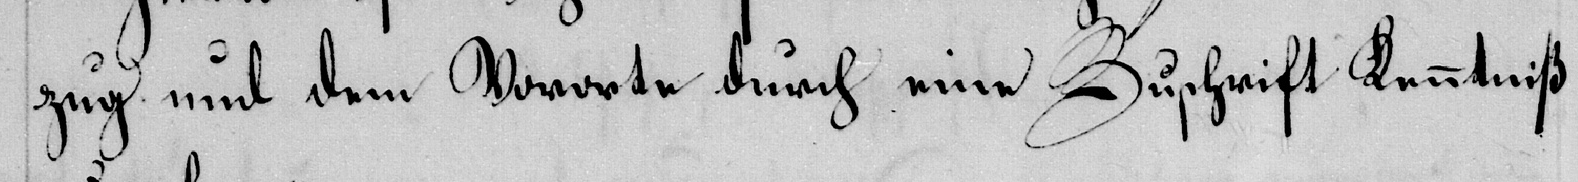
zug und dem Vororte durch eine Zuschrift Kenntniß
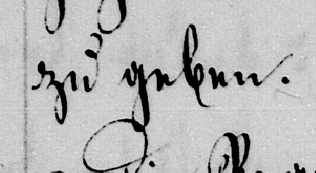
zu geben.
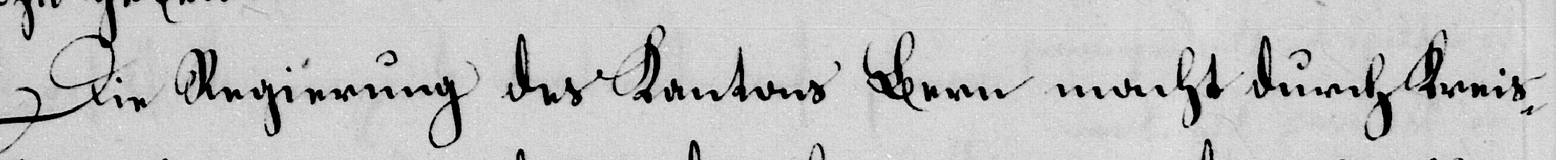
Die Regierung des Kantons Bern macht durch Kreis¬
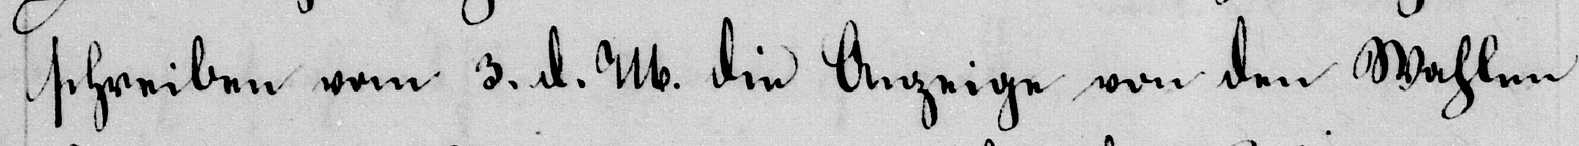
schreiben vom 3. d. M. die Anzeige von den Wahlen
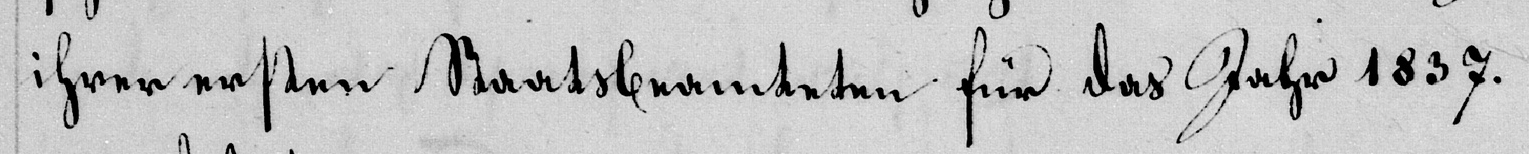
ihrer ersten Staatsbeamten für das Jahr 1837.
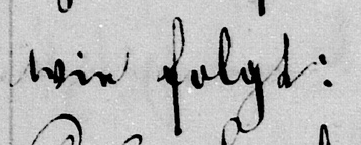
wie folgt:
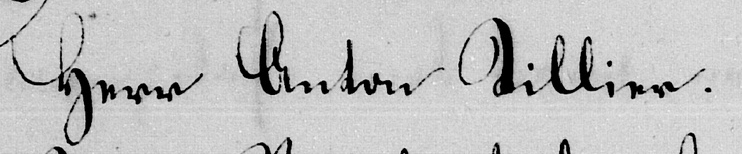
Herr Anton Tillier.
